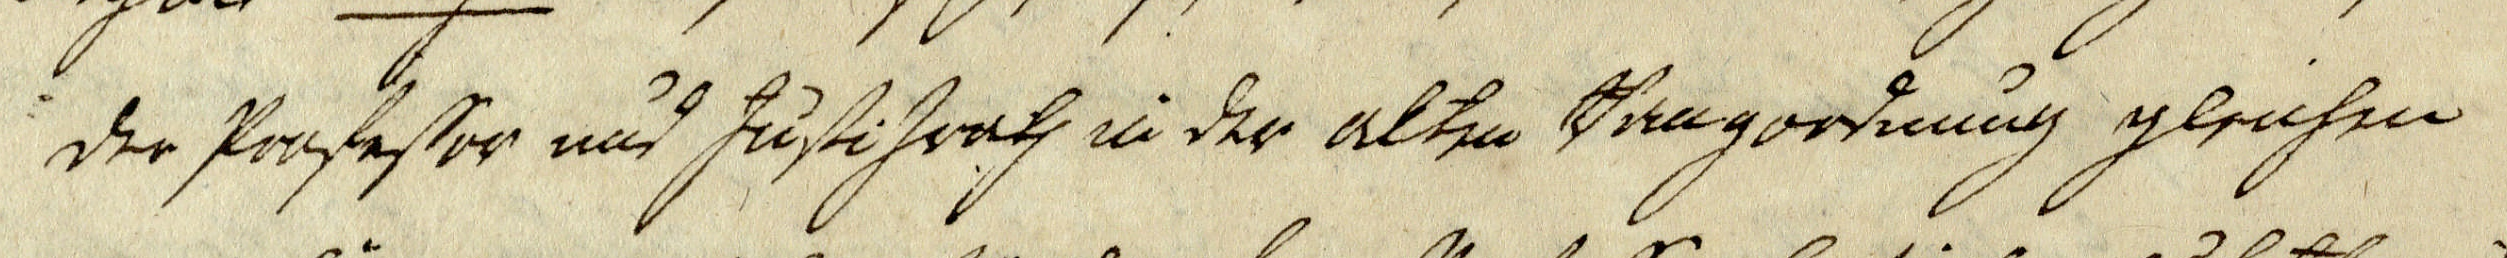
der Professor und Justizrath in der alten Rangordnung gleichen
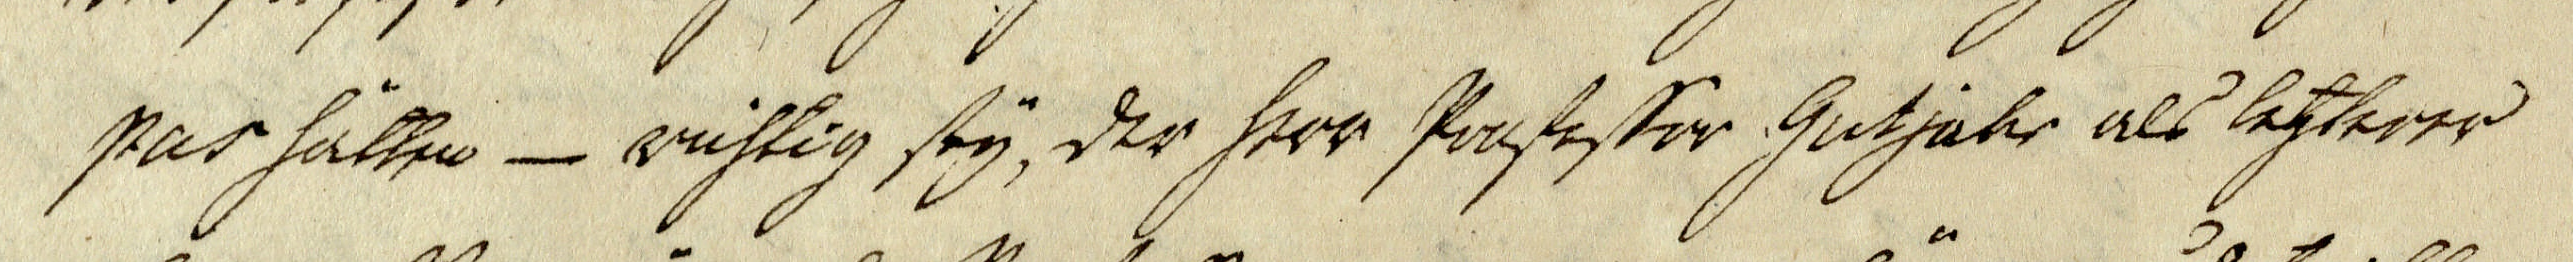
per hätten - richtig seÿ, der Herr Professor Gutjahr als letzterer
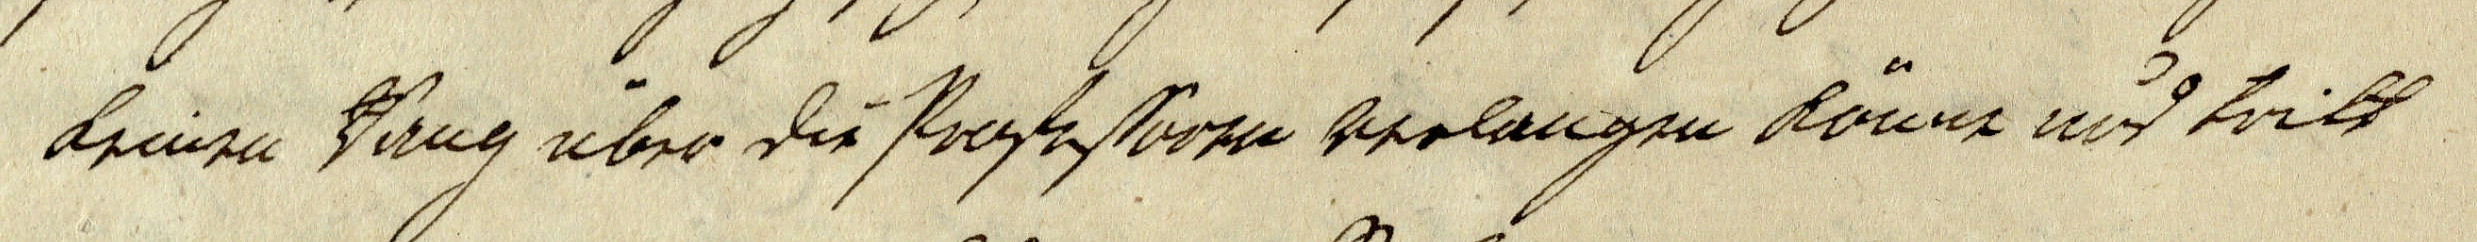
keinen Rang über die Professoren verlangen könne und tritt
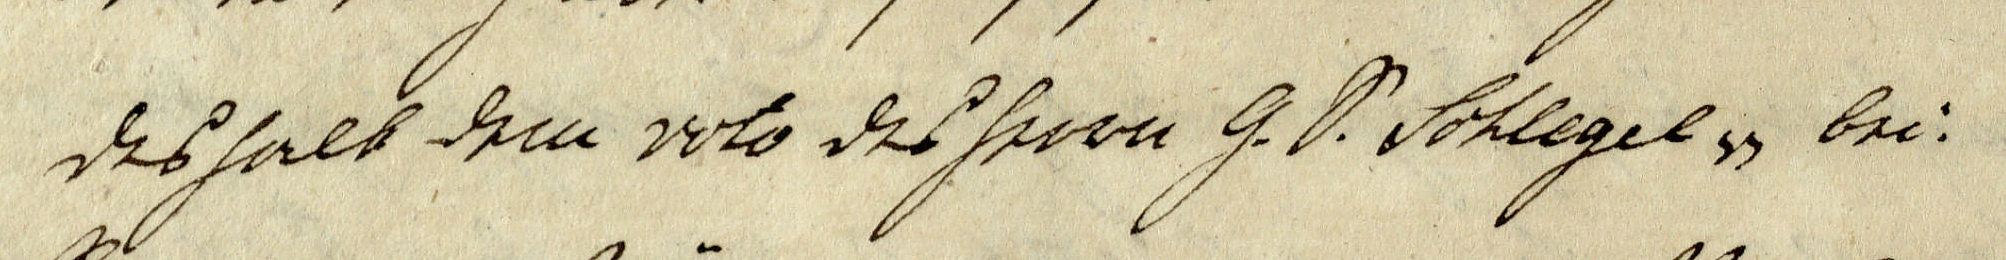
deshalb dem voto des Herrn G. S. Schlegel bei.
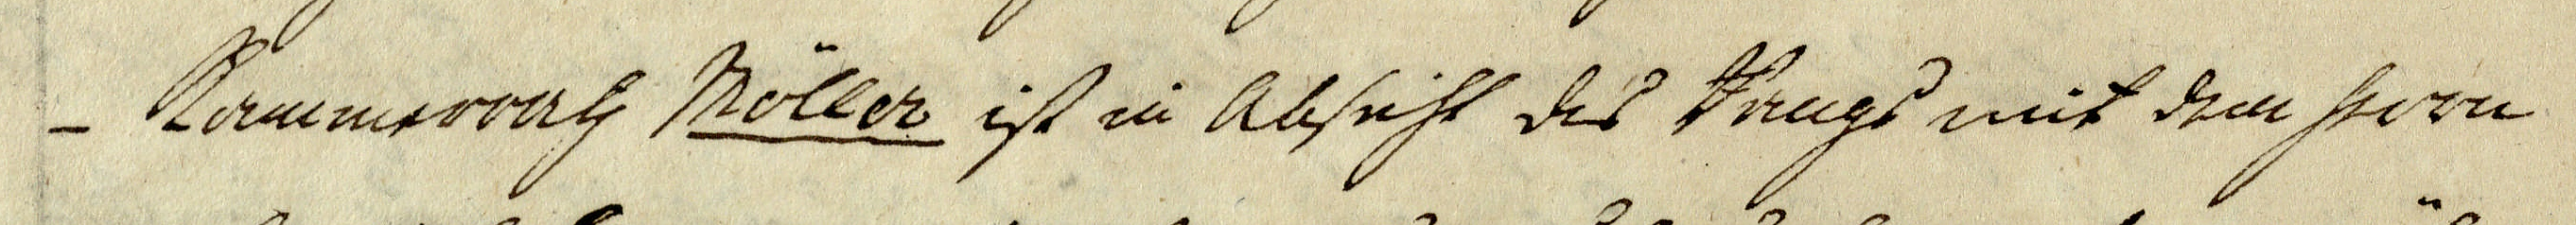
Kammerrath Möller ist in Absicht des Rangs mit dem Herrn
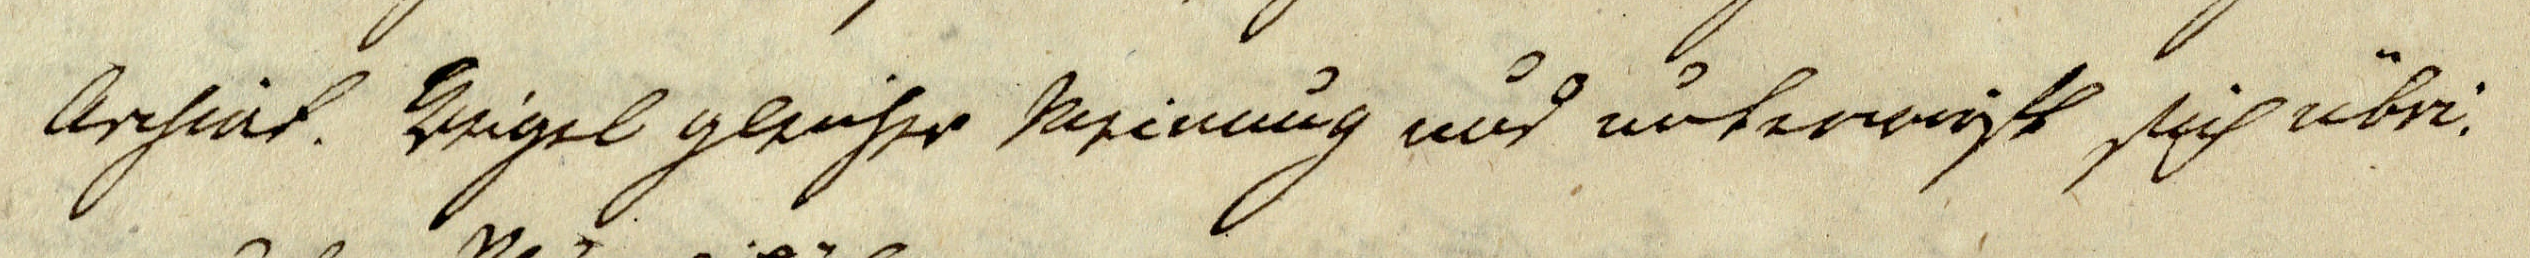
Archiat. Weigel gleicher Meinung und unterwirft sich übri¬
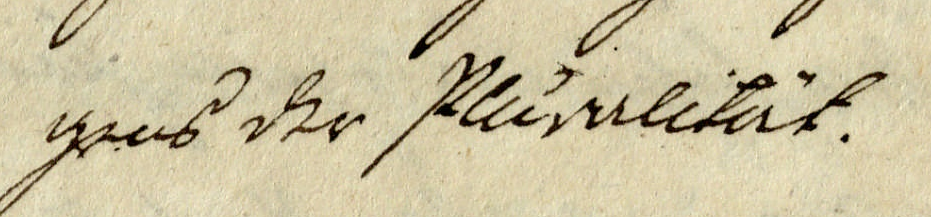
gens der Pluralität.
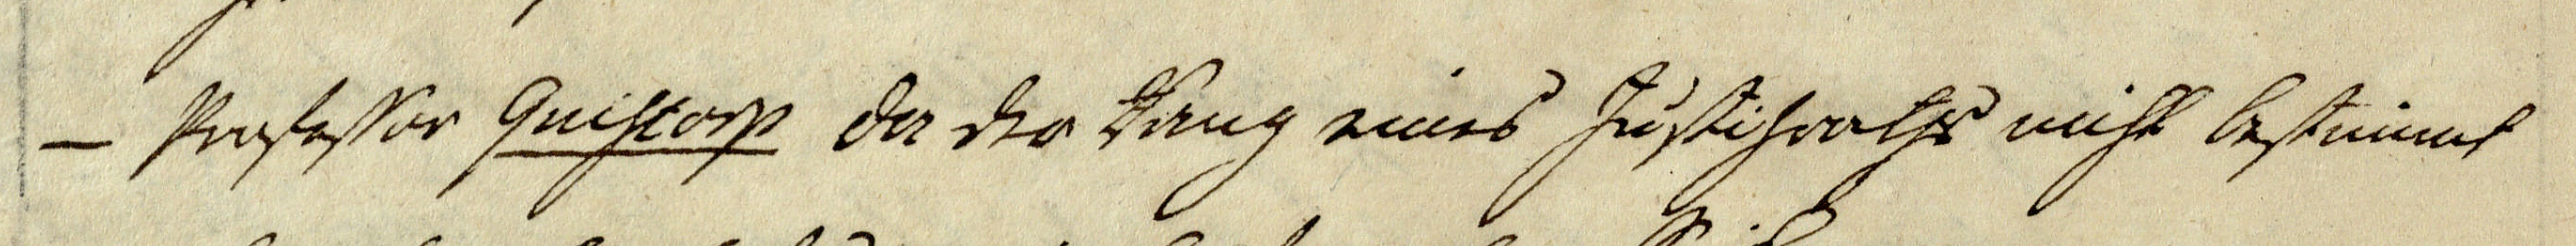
Professor Quistorp Da der Rang eines Justizraths nicht bestimmt
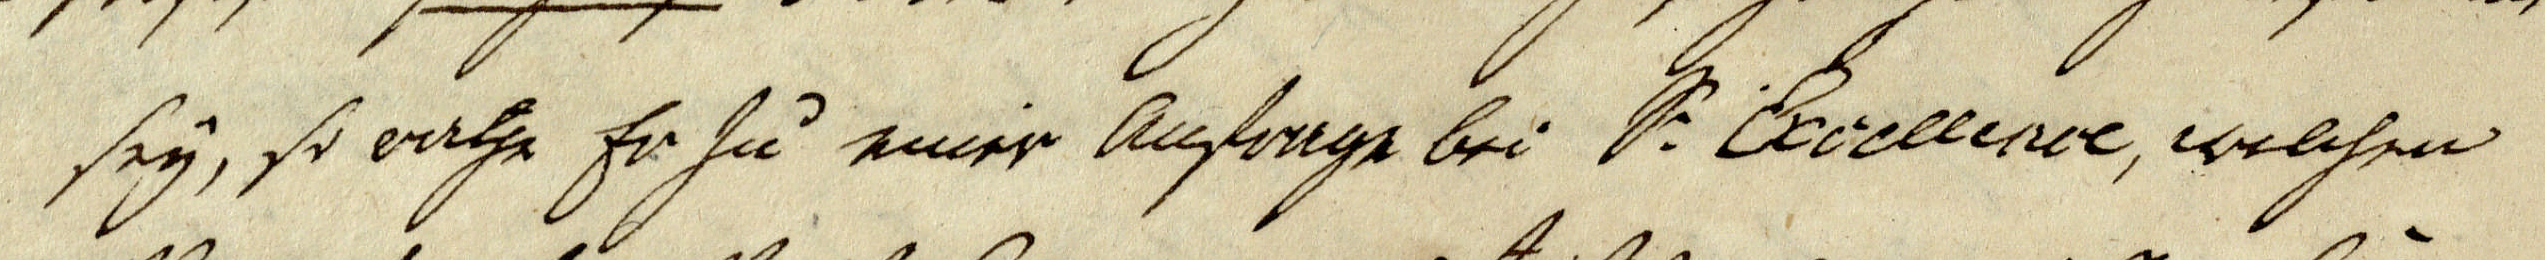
seÿ, so rathe Er zu einer Anfrage bei Sr. Excellence, welchen
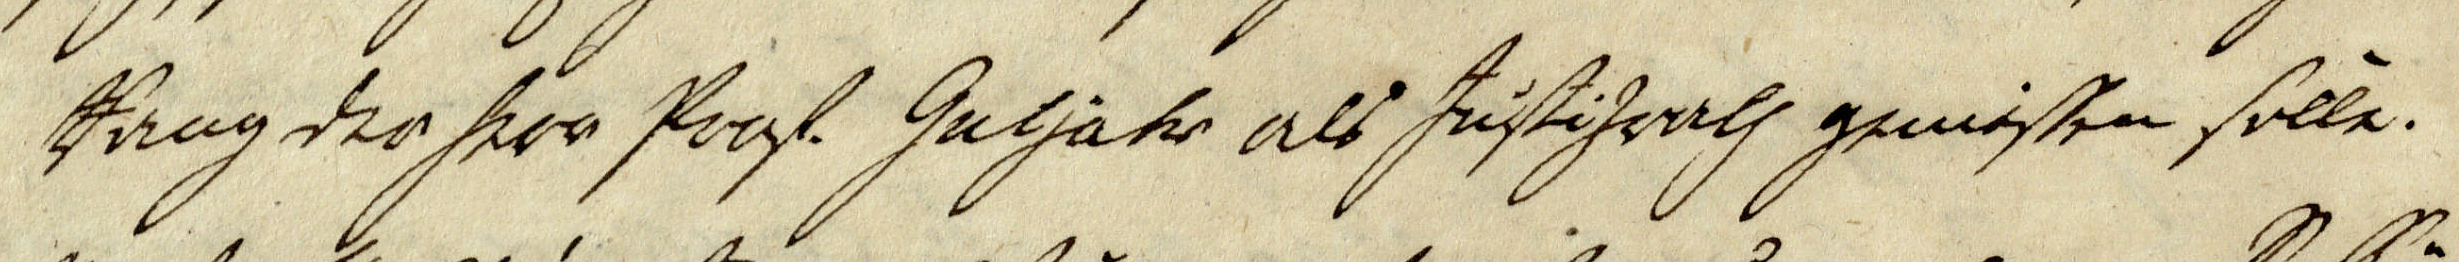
Rang der Herr Prof. Gutjahr als Justizrath geniessen solle.
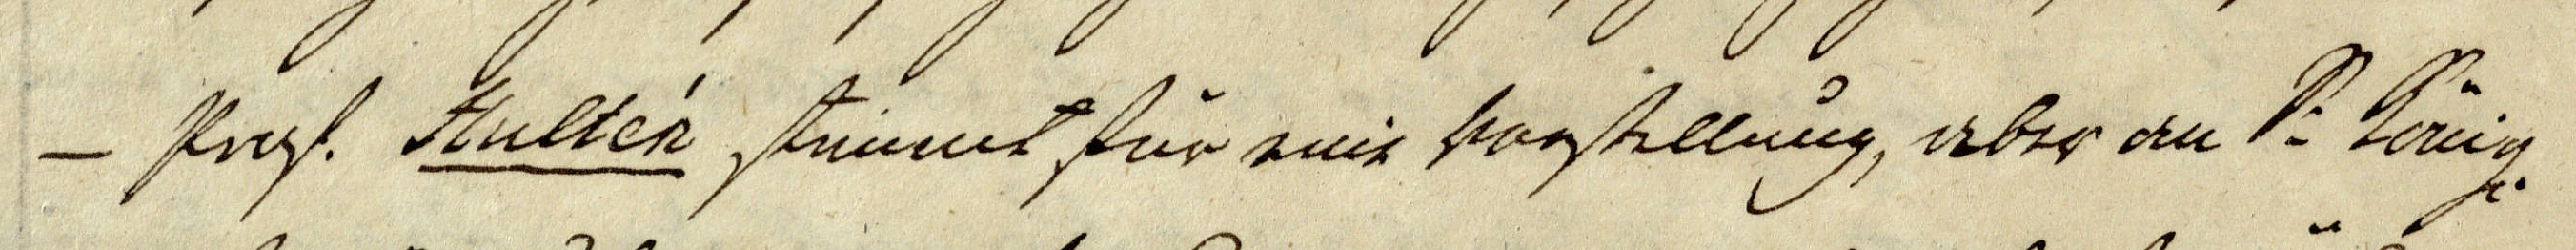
Prof. Hultén stimmt für eine Vorstellung, aber an Sr. König.
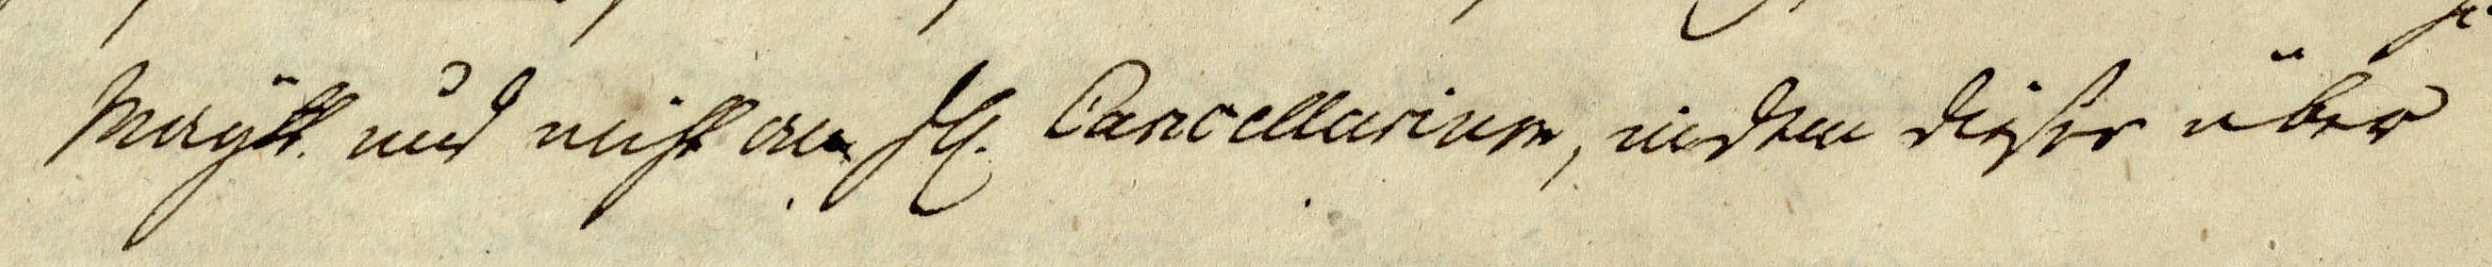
Maÿtt und nicht an Ill. Cancellarium, indem dieser über
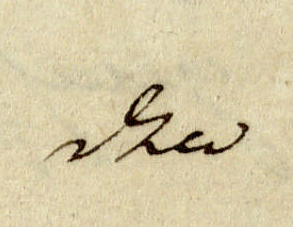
den
